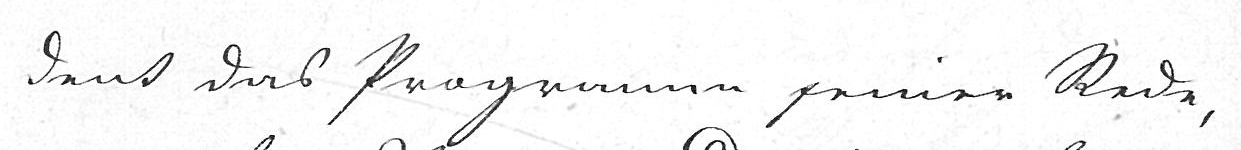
dent das Programm seiner Rede,
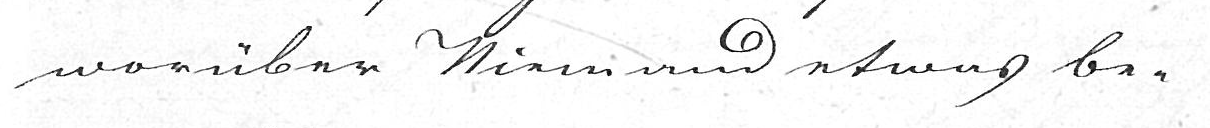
worüber Niemand etwas be-
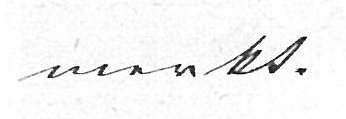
merkt.
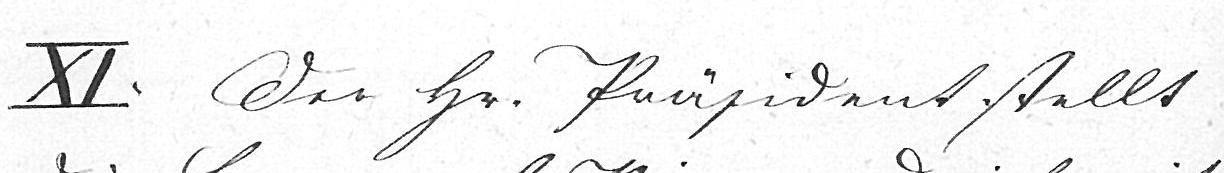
XI. Der Hr. Präsident stellt
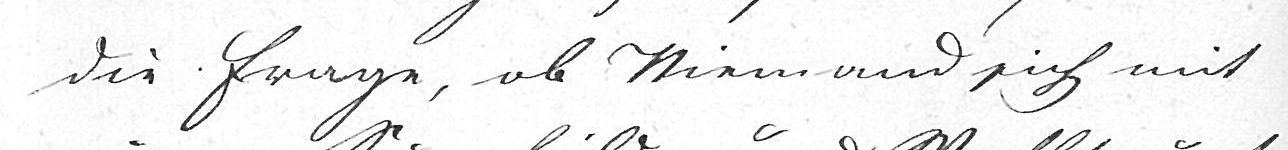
die Frage, ob Niemand sich mit
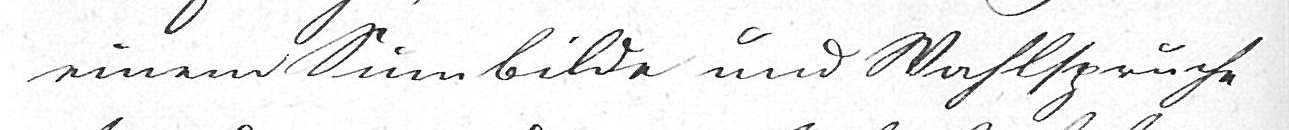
einem Sinnbilde und Wahlspruche
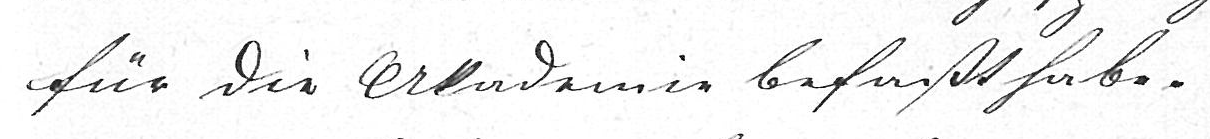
für die Akademie befaßt habe.
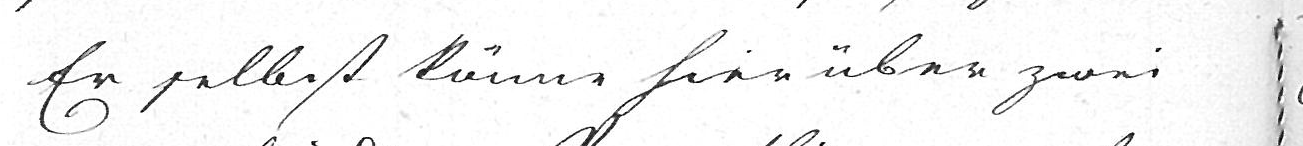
Er selbst könne hierüber zwei
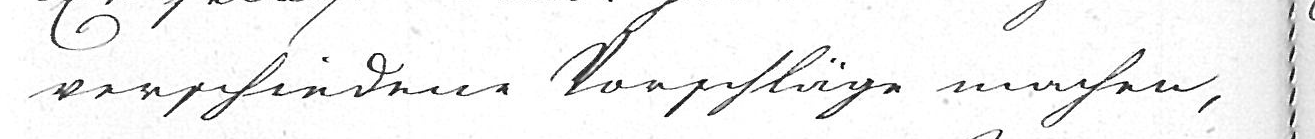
verschiedene Vorschläge machen
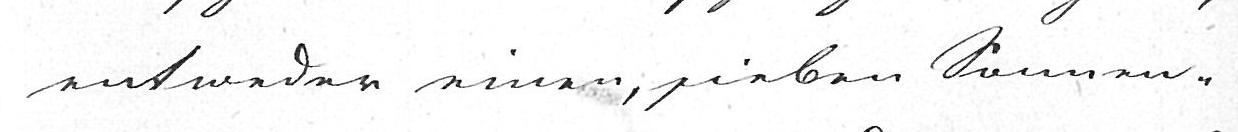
entweder einen, sieben Sonnen-
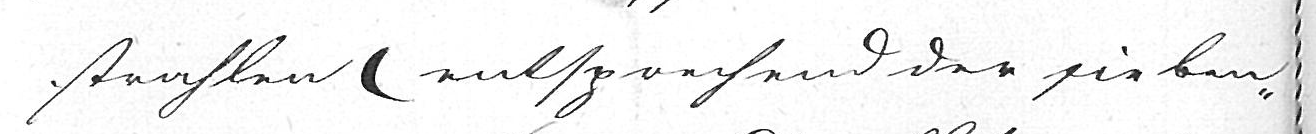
strahlen (entsprechend der sieben-
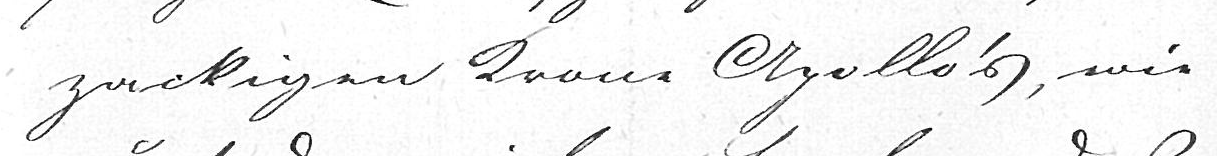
zackigen Krone Apollo's, wie
